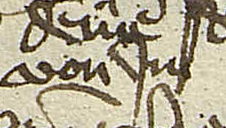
von Im
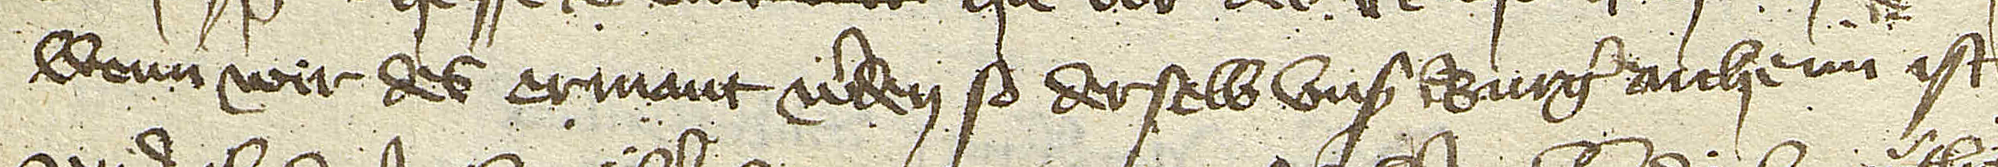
wenn wir des ermant w*den ſo derſelb vnſ* Burg* anheim iſt
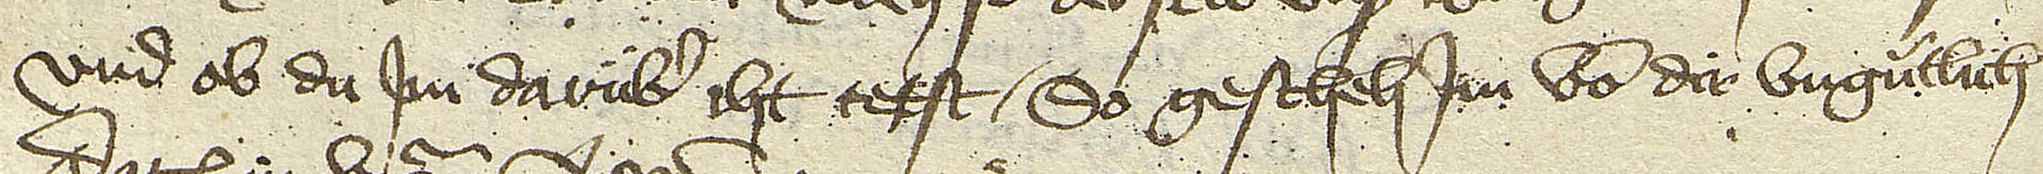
vnd ob du Im darüb* iht tetſt / So geſcheh Im vo* dir vngütlich
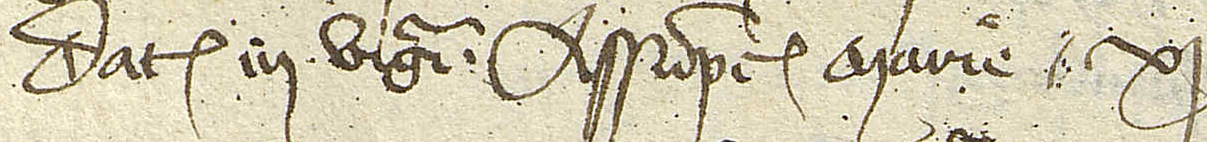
Dat* in vigi* . Aſſu*pc* Marie / xi
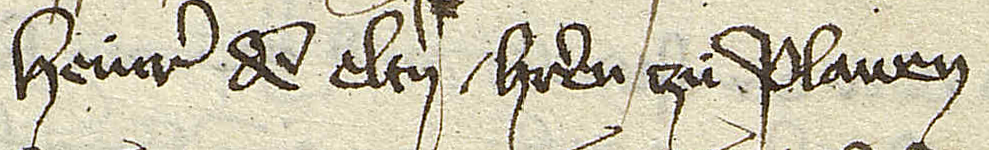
heinr* d* eltn* / hr*en cʒü Plawen
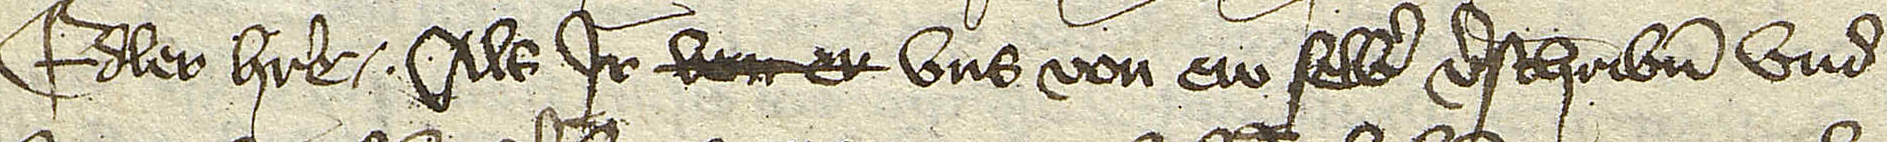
Edler hr*e / . Als Ir von er vns von ew ſelb* v*ſchribn* vnd
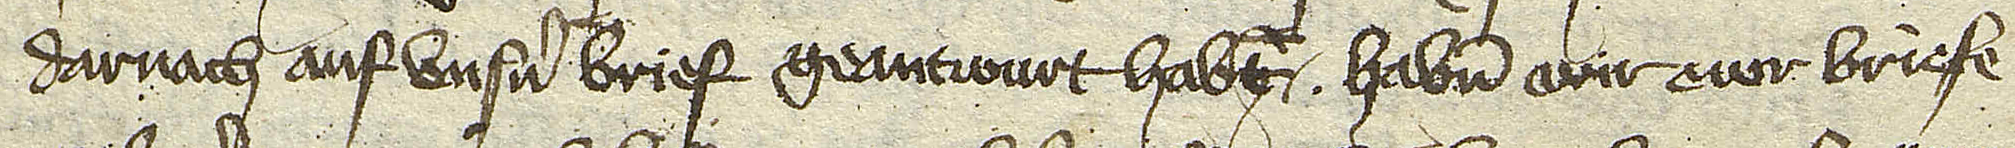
darnach auf vnſn* brief geantwurt habt / . habn* wir ewr briefe
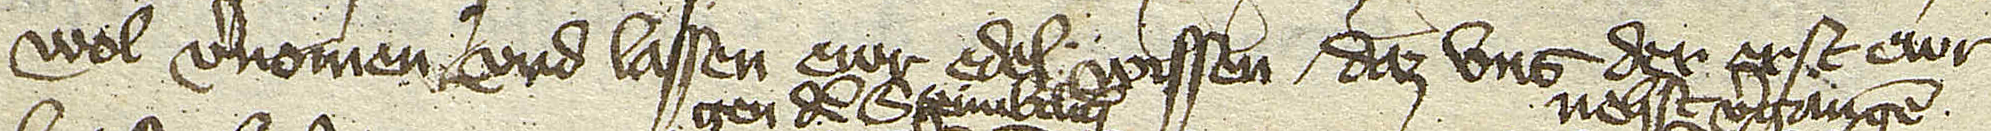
wol v*nomen vnd laſſen ewr edel wiſſen / daʒ vns der erſt ewr
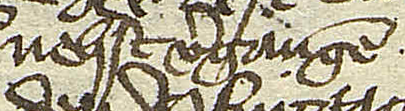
nehſt v*gange*
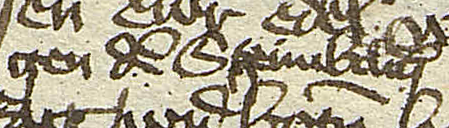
gen d* Steimbach
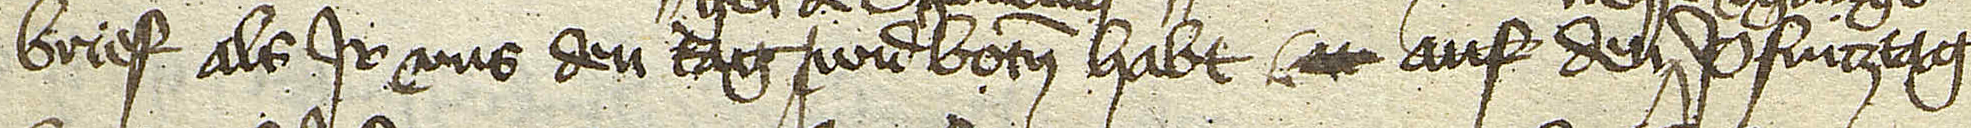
brief als Ir vns den tag wid* botn* habt / a auf den Pfincʒtag
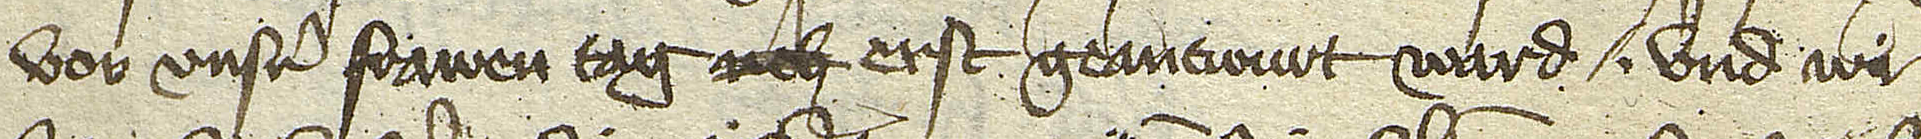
vor vnſr* frawen tag neh erſt geantwurt ward / . vnd wir
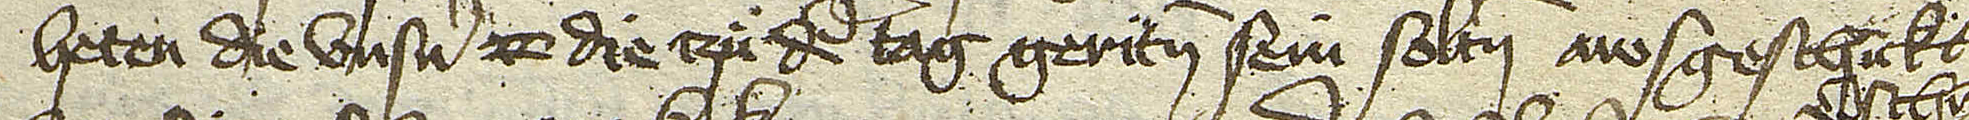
heten die vnſn* v die cʒü d* tag geritn* ſein ſoltn* awſgeſchickt
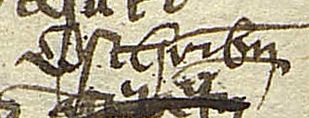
v*ſchribn*
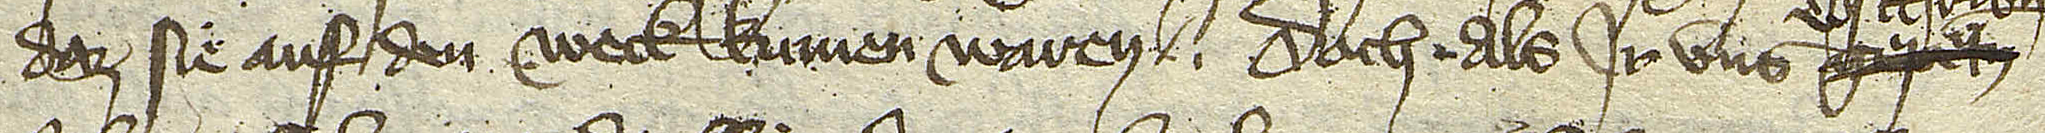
daʒ ſie auf den weck kumen waren / . Doch ~ als Ir vns gepetn
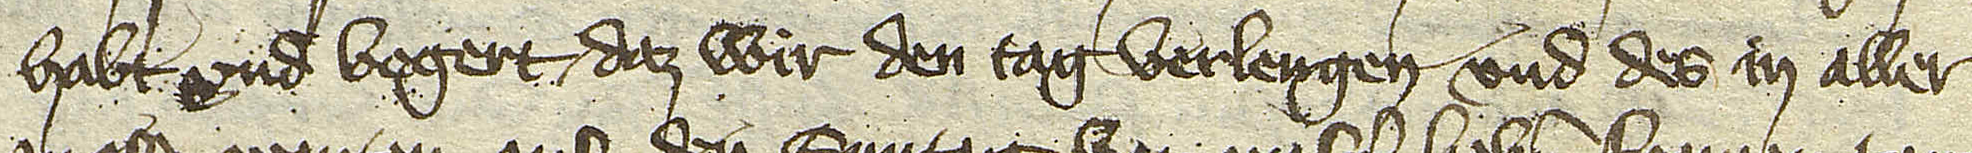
habt vnd begert / daʒ wir den tag verlengen vnd des in aller
